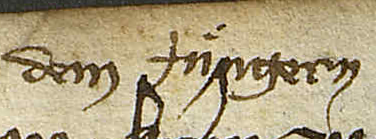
dem Iüngern
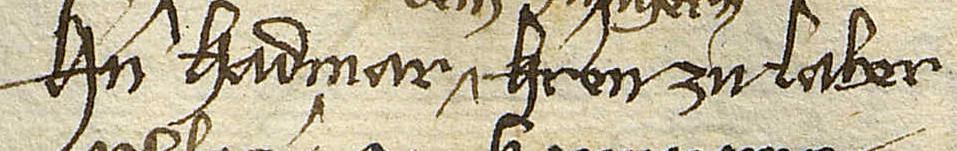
Hn* hadmar h*ren zu laber
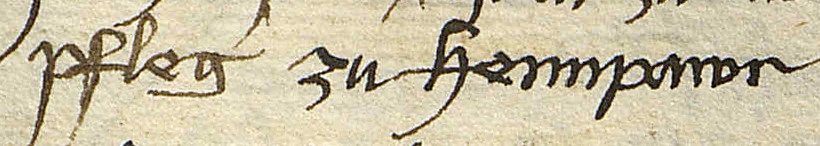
pfleg* ʒu heimpawr
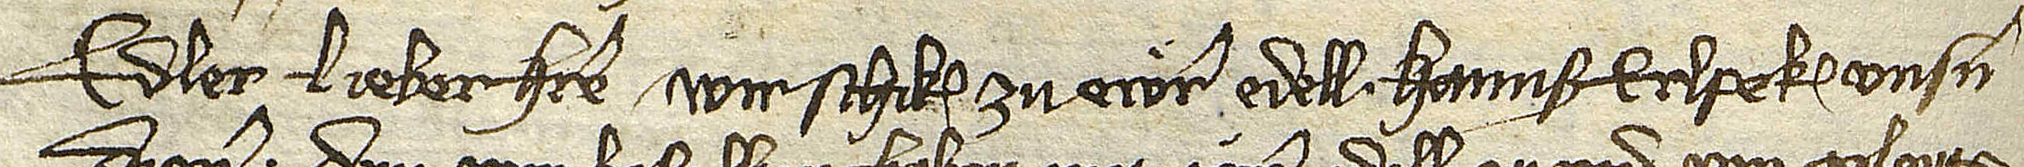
Edler lieber h*re / wir ſchik* ʒu ewr* edell hannſ* Erlpek* vnſ*n
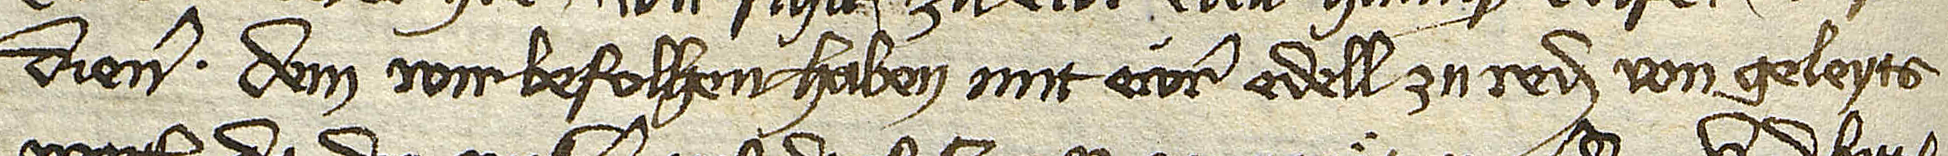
dien* . dem wir befolhen haben mit ewr* edell ʒu red* von geleyts
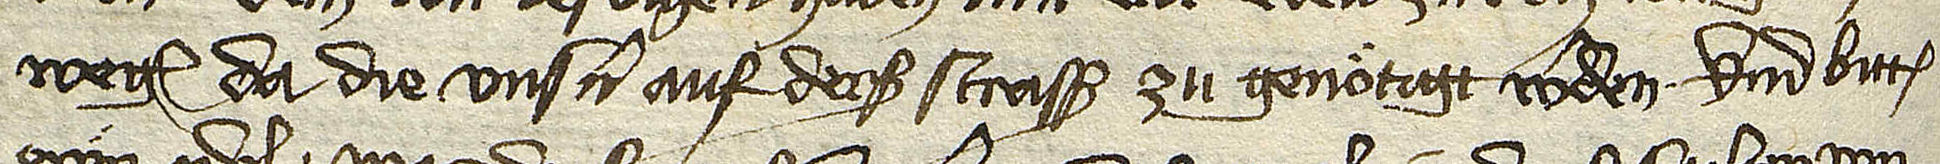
weg* da die vnſ*n auf derſ* ſtraſſ* ʒu genötigt w*den . Vnd bitt*
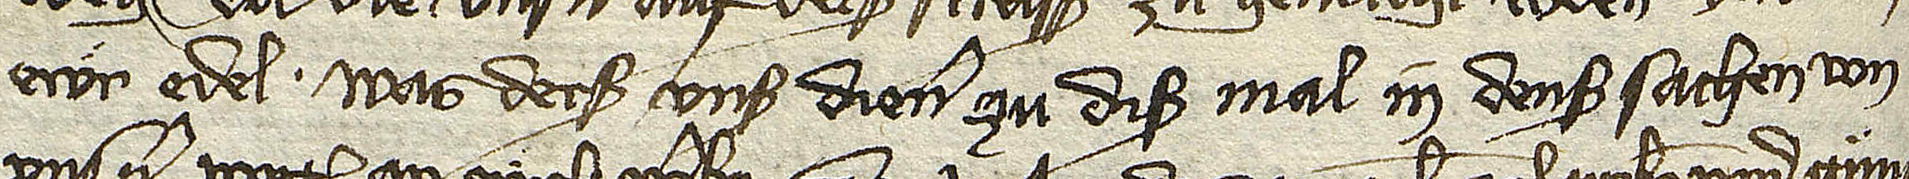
eẅr edel . was derſ* vnſ* dien* ʒu diſ* mal in denſ* ſachen von
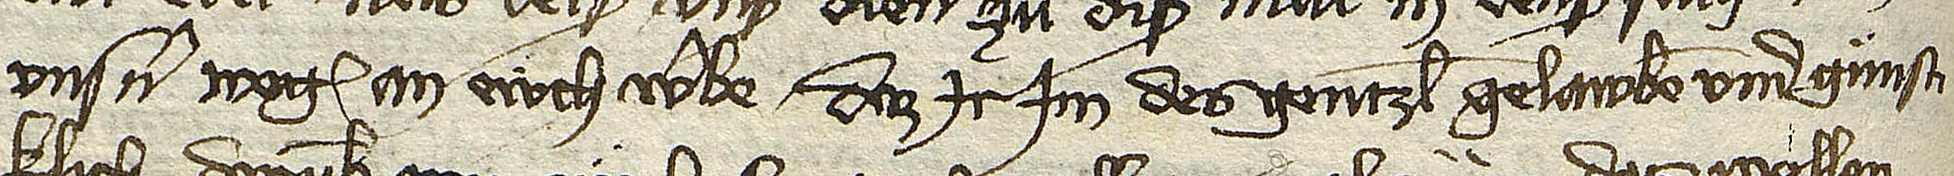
vnſ*n weg* an eẅch w*be / Daʒ Ir Im des gencʒl* gelawbe* vnd günſti
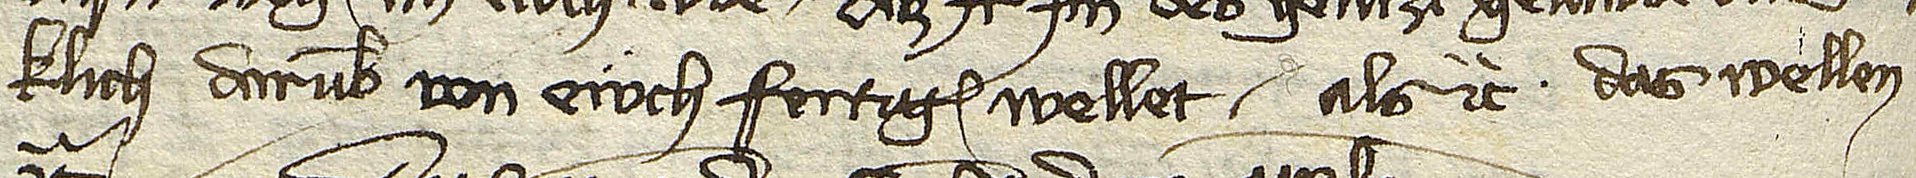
klich darub*von eẅch fertig* wellet / als ec* . das wellen
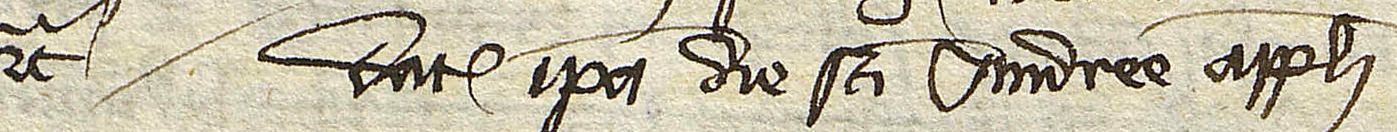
ec* / Dat* ipa* die ſci* Andree appli*
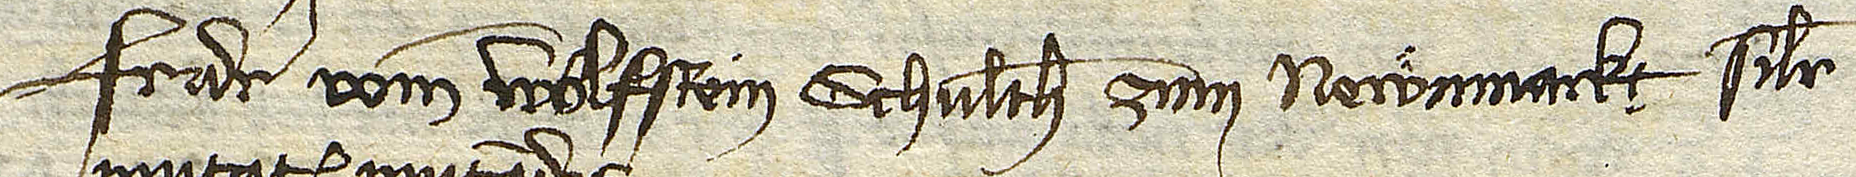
Fridr* vom* Wolfſtein Schulth* ʒum Neẅnmarkt ſilr*
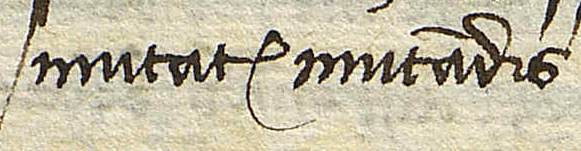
mutat* muta*dis
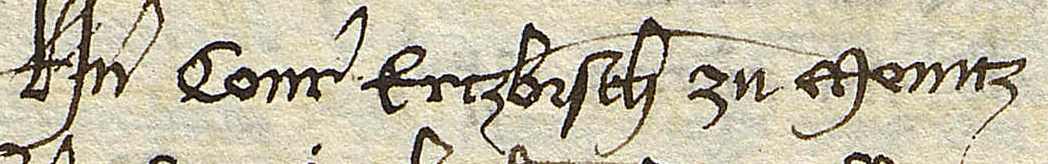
Hn* Conr* Ercʒbiſch* ʒu Meincʒ
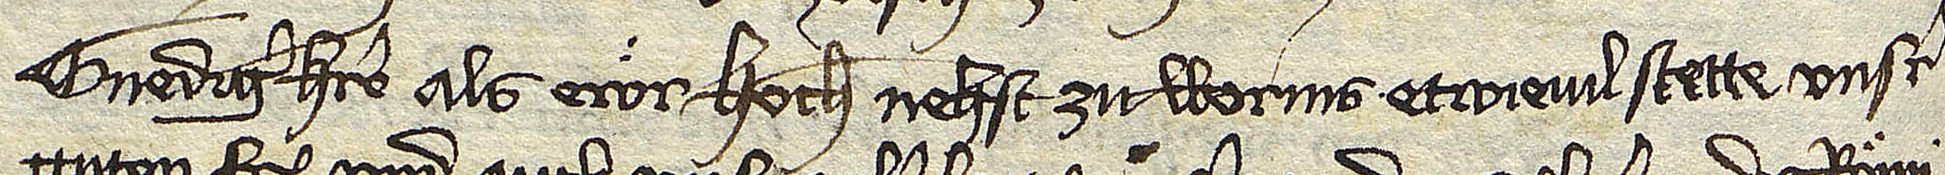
Gnedig* h*re als ewr hoch* nehſt ʒu Worms etwieuil ſtette vnſ*r
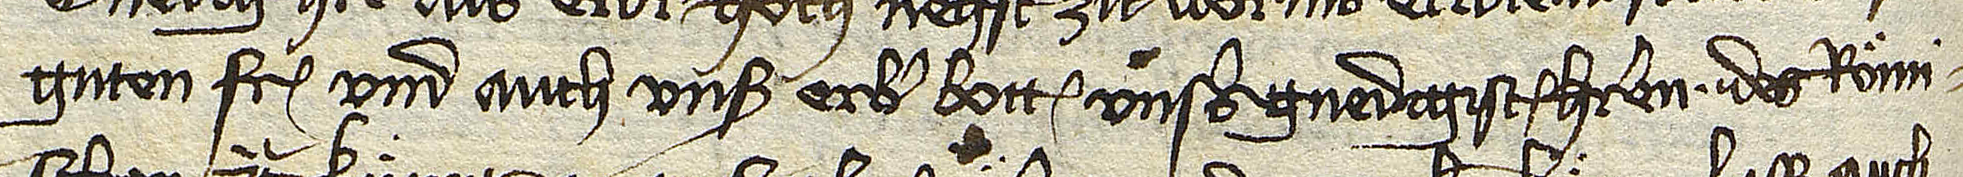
guten fr* vnd auch vnſ* erb* bott* vnſ* gnedigiſt* h*ren ~ des Römi =
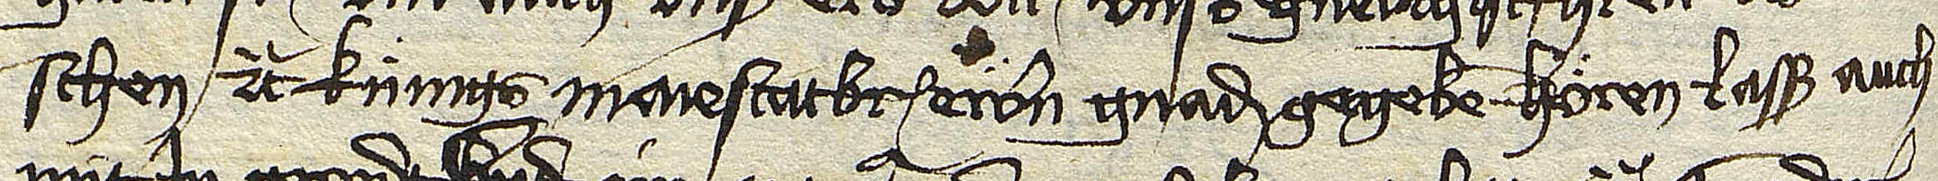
ſchen ec* künigs maieſtatbr* ew*n gnad* gegebe* . hören laſſ* auch
